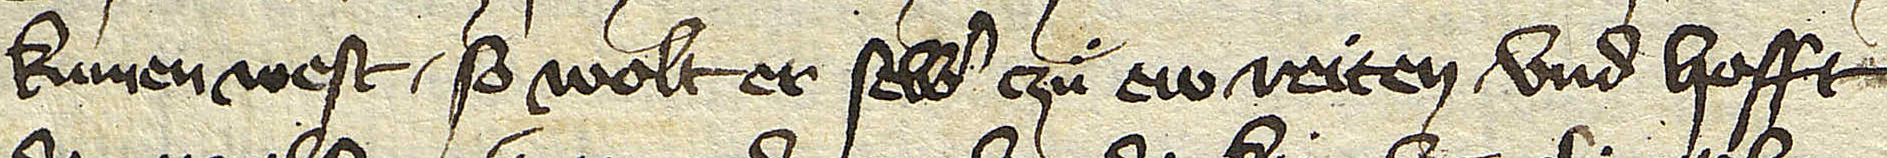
kumen weſt / ſo wolt er ſelb* cʒü ew reiten / vnd hofft
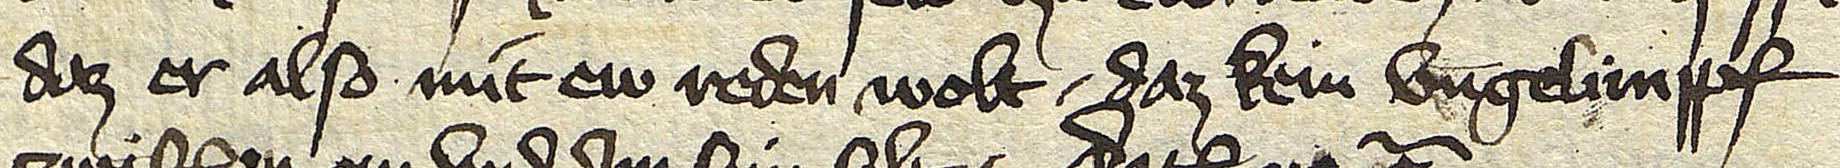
daʒ er alſo mit ew reden wolt / daʒ kein vngelimppf
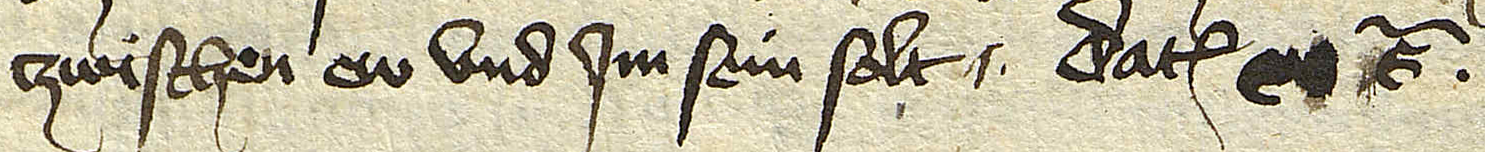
cʒwiſchen ew vnd Im ſein ſolt / . Dat* vt s* .
